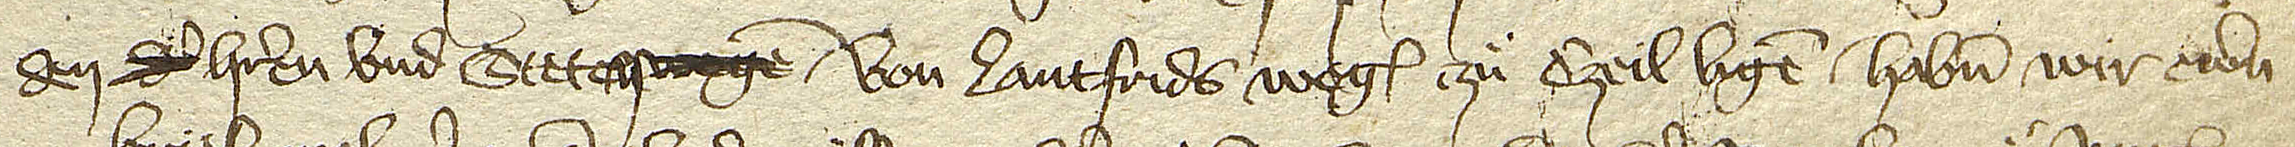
den d* hr*en vnd Steten wege* / von lantfrids weg* cʒü Cʒeil lige* / habn* wir ew*n
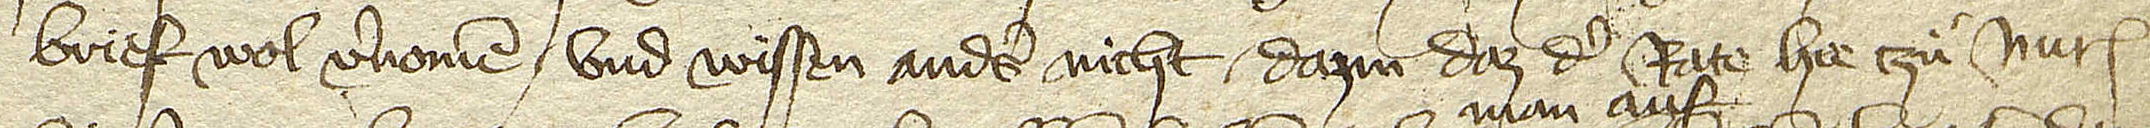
brief wol v*nome* / vnd wiſſen ands* nicht / daʒnn daʒ d* Rate her cʒü Nur*
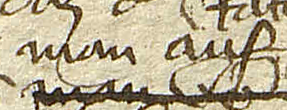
man auf
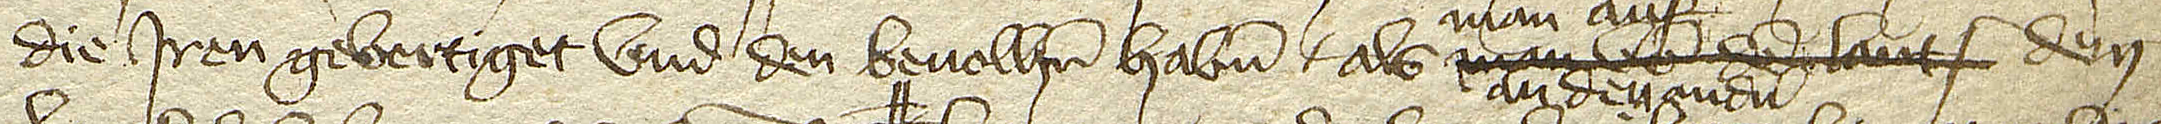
die iren gevertiget vnd den beuolhn* habn* / als man vo* d* lantf dem
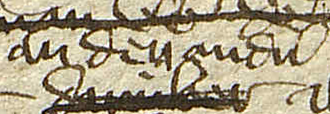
an den andn*
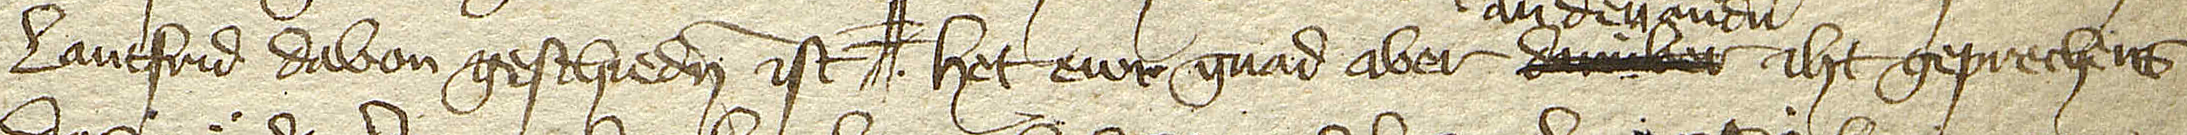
lantfrid davon geſchiedn* iſt / . het ewr gnad aber darüber iht geprechens
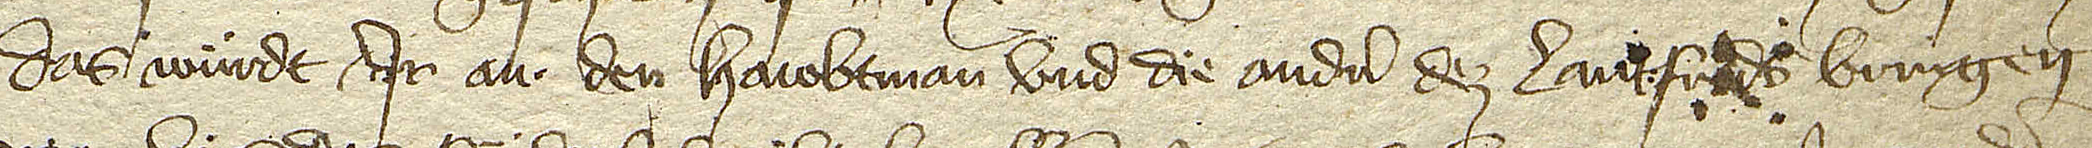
das würdt / Ir an den hawbtman vnd die andn* deʒ lantfrids bringen
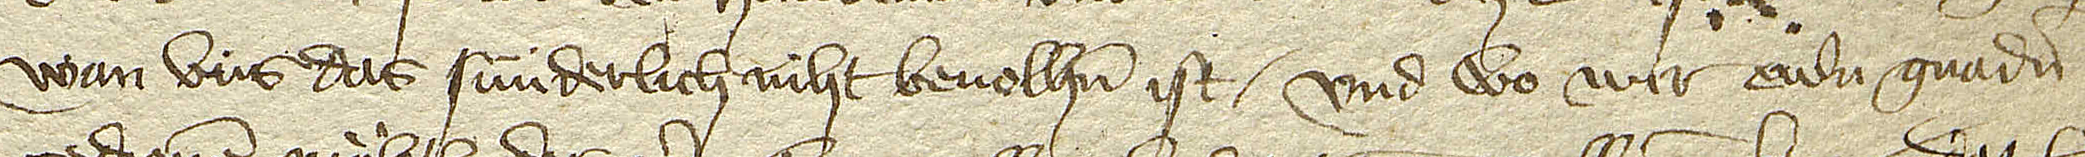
wan vns das ſünderlich niht beuolhn* iſt / vnd wo wir ewn* gnadn*
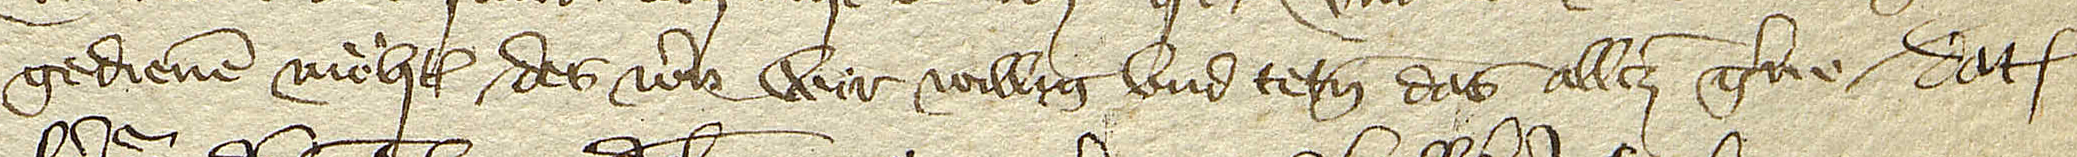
gediene* möht* / das w*n wir willig vnd tetn* das allcʒ* g*ne / dat*
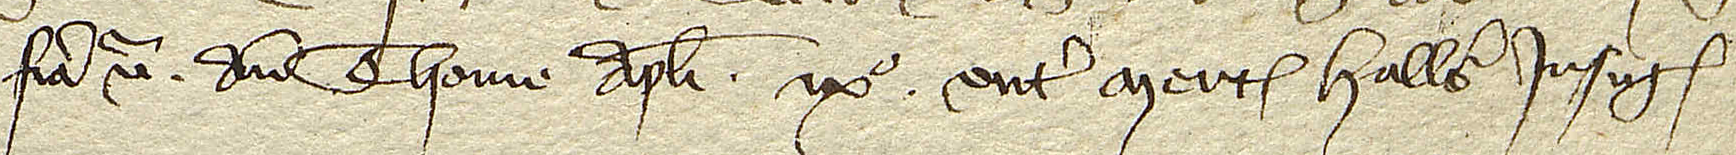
fia* v* . An* Thome Apli* . ix* . vnt* Mert* halls* Inſig*
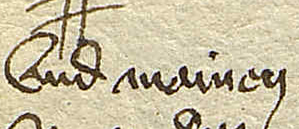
vnd mainen
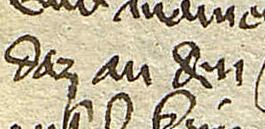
daʒ an den
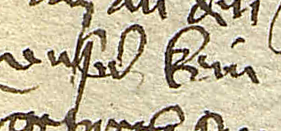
vnſn* kein
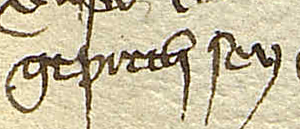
geprech ſey
